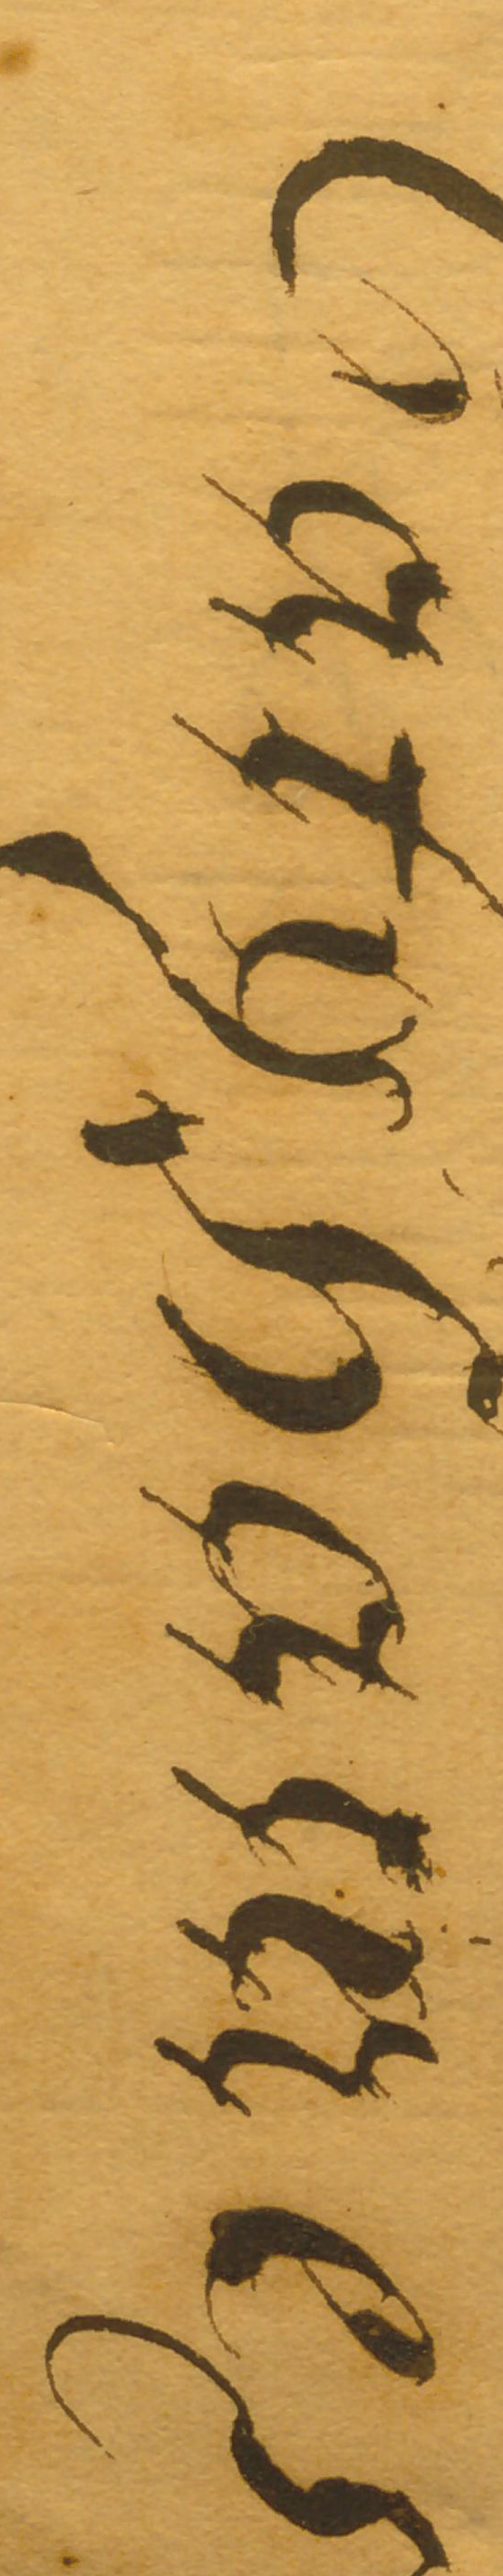Caty Haines
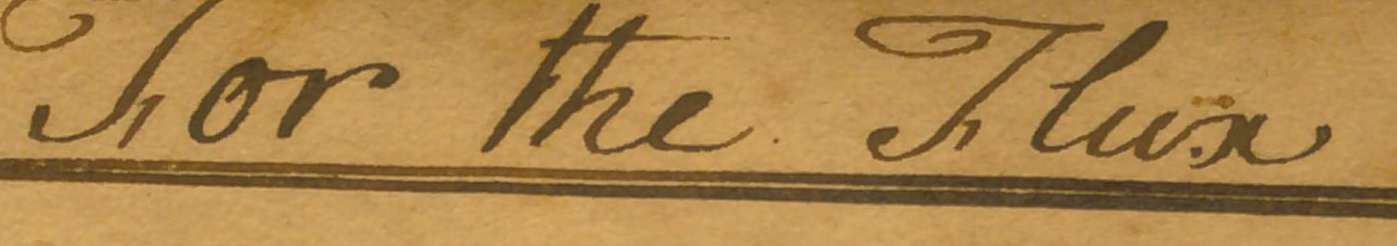For the Flux
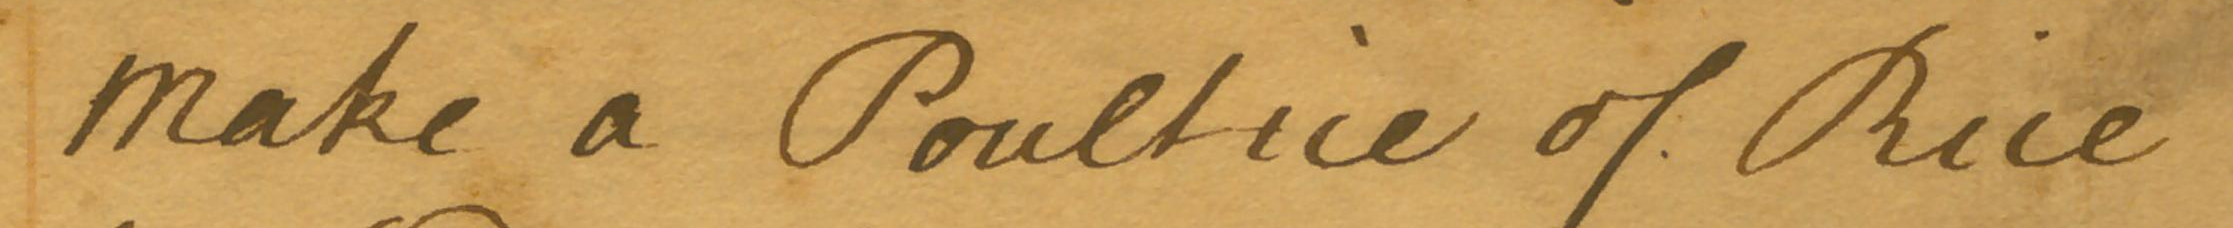make a Poultice of Rice
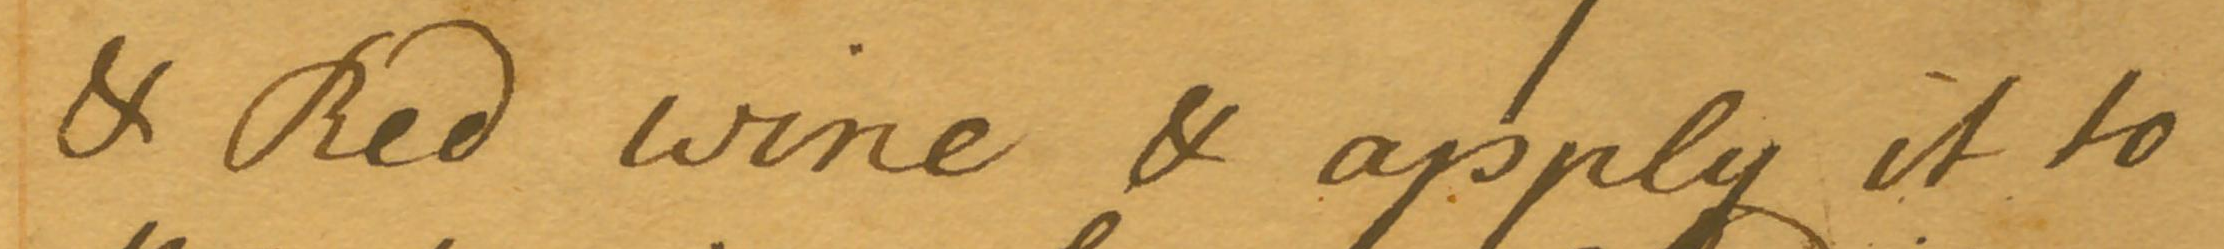& Red wine & apply it to
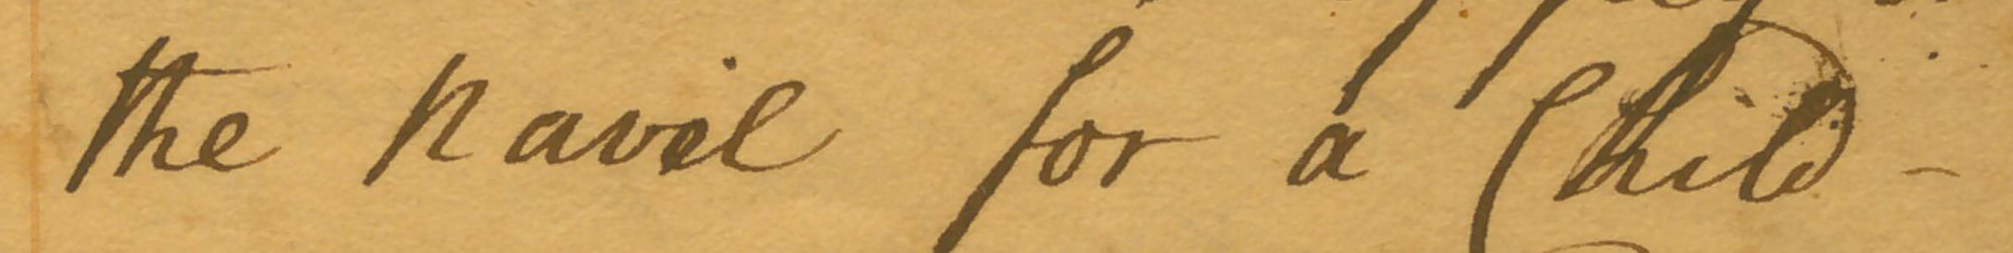the navel for a Child-
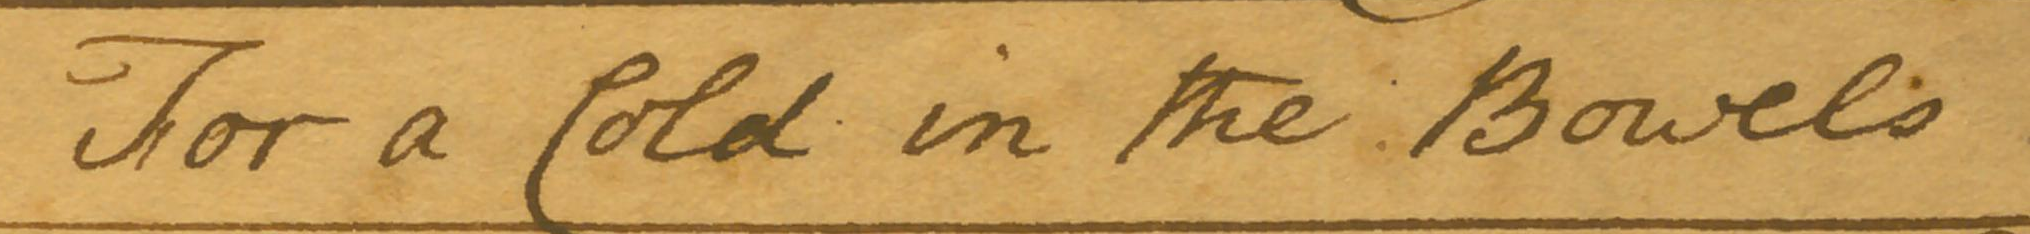For a Cold in the Bowels
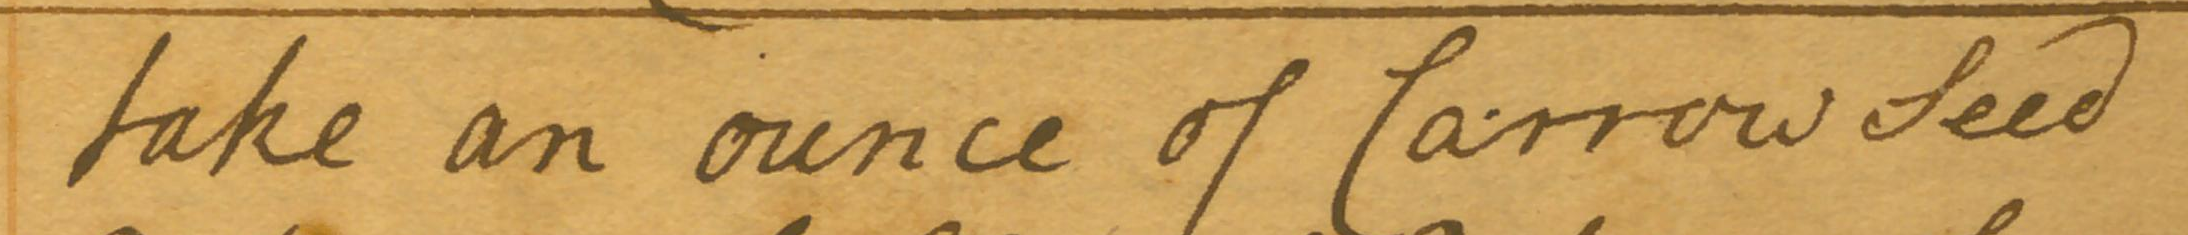take an ounce of Carrow seed
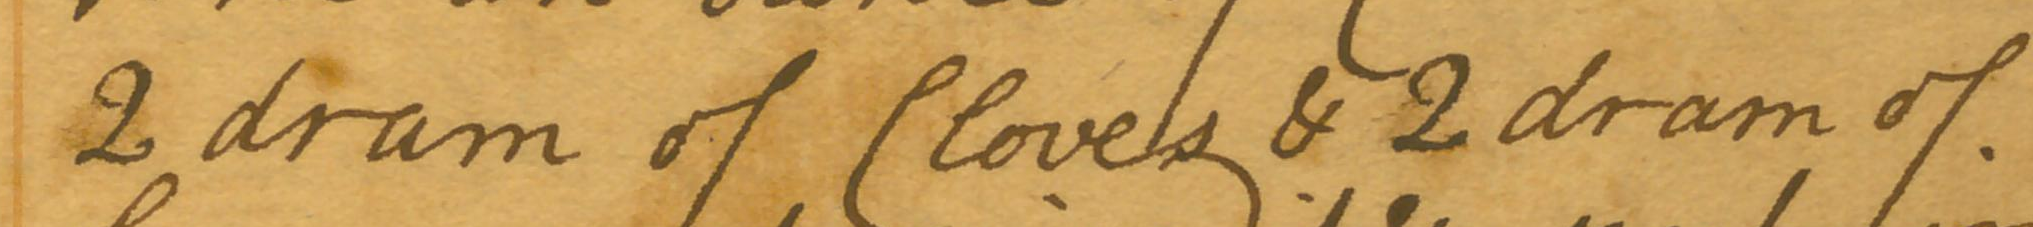2 dram of Cloves & 2 dram of
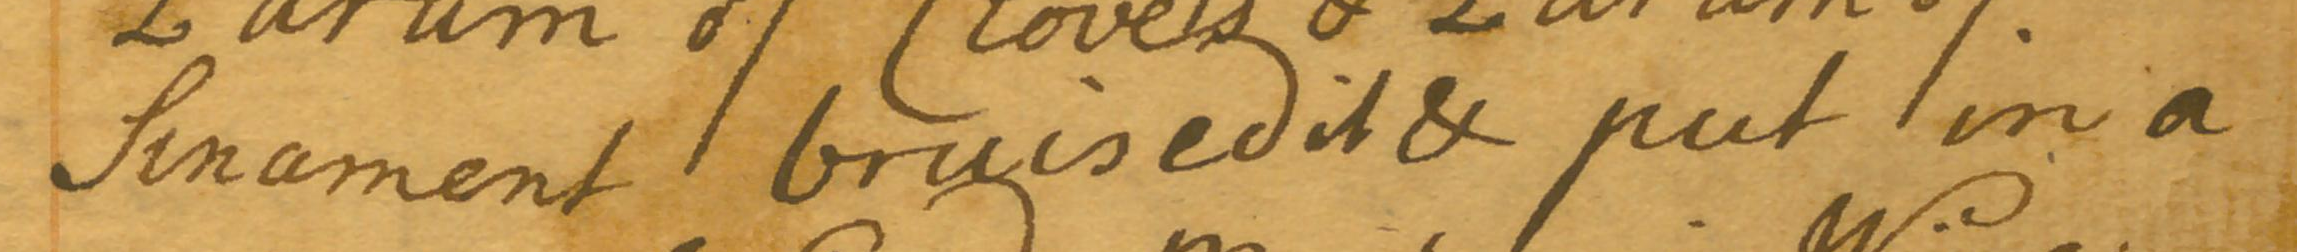Sinament bruised it & put in a
